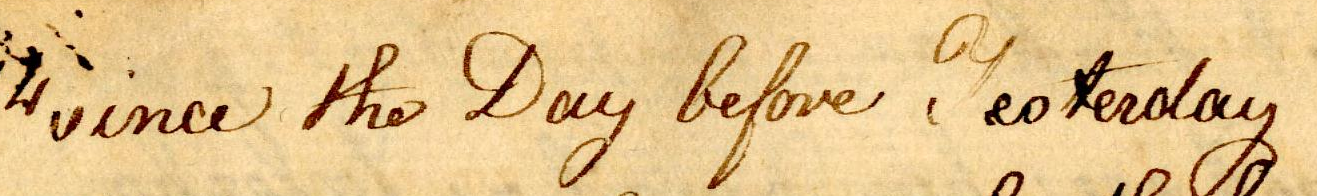since the Day before Yesterday
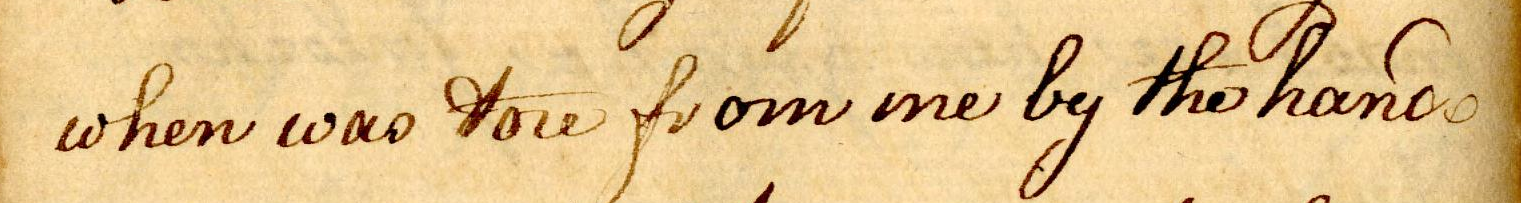when was tore from me by the hands
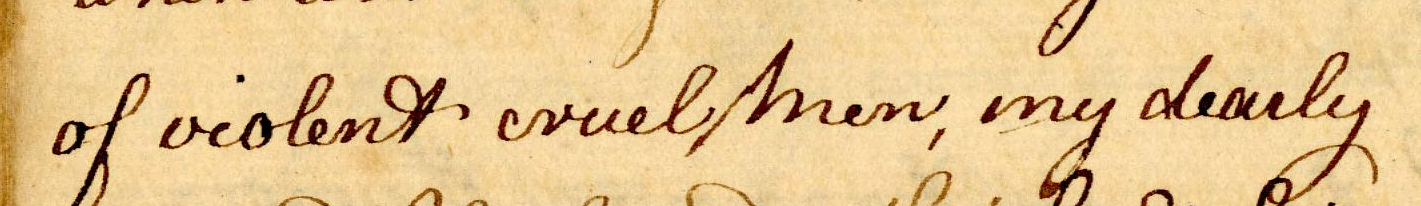of violent cruel Men, my dearly
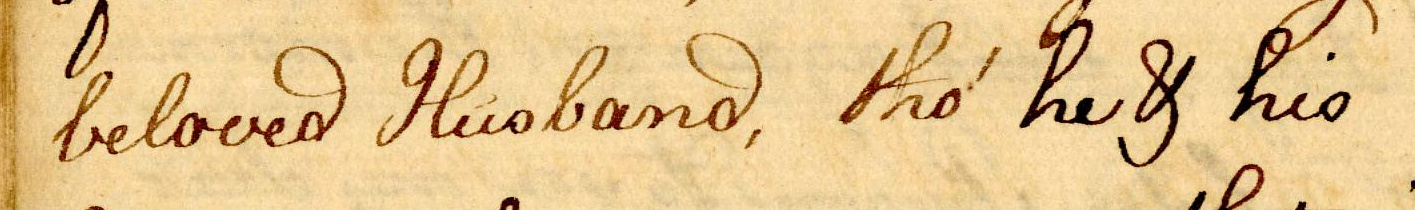beloved Husband, tho' he & his
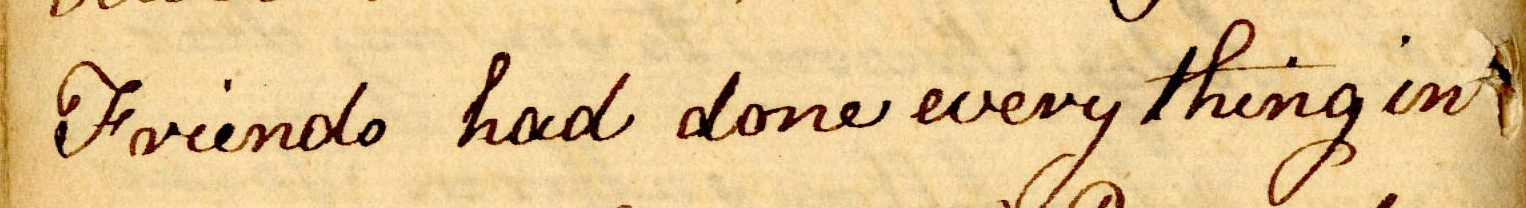Friends had done everything in
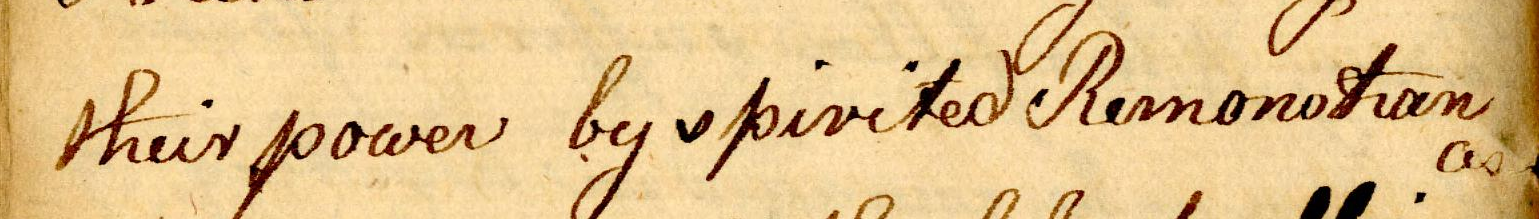their power by spirited Remonstran
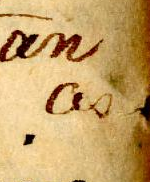ces
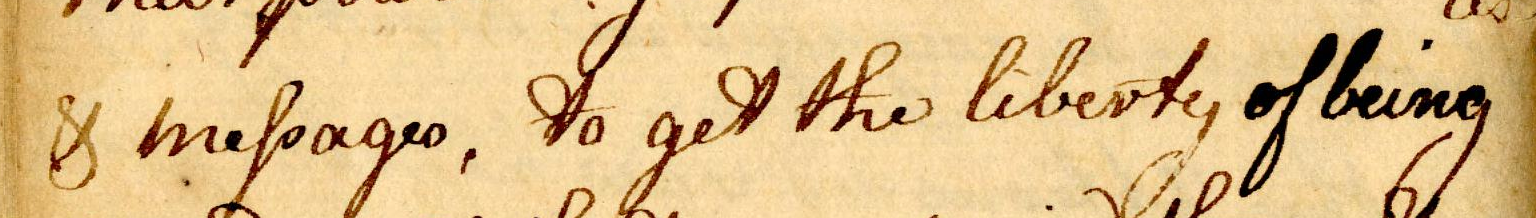& messages, to get the liberty of being
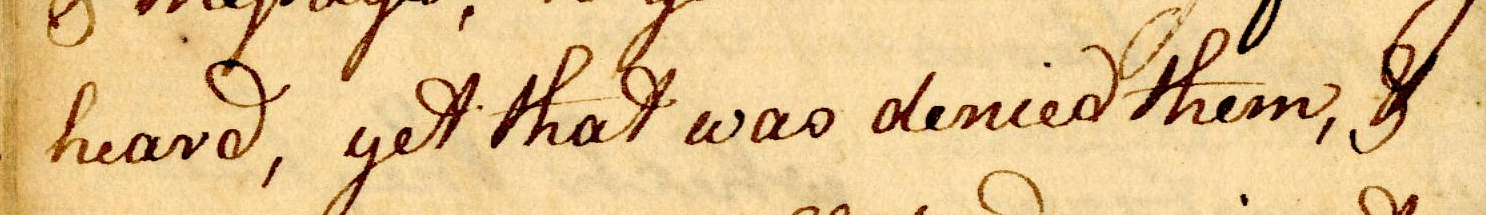heard, yet that was denied them, &
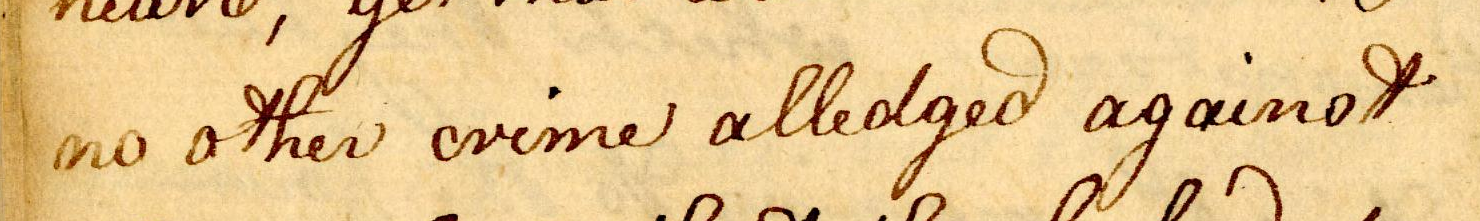no other crime alledged against
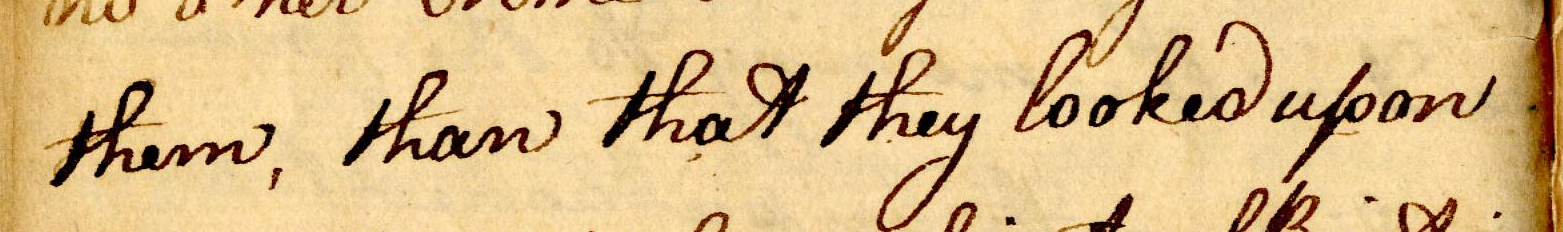them, than that they looked upon
